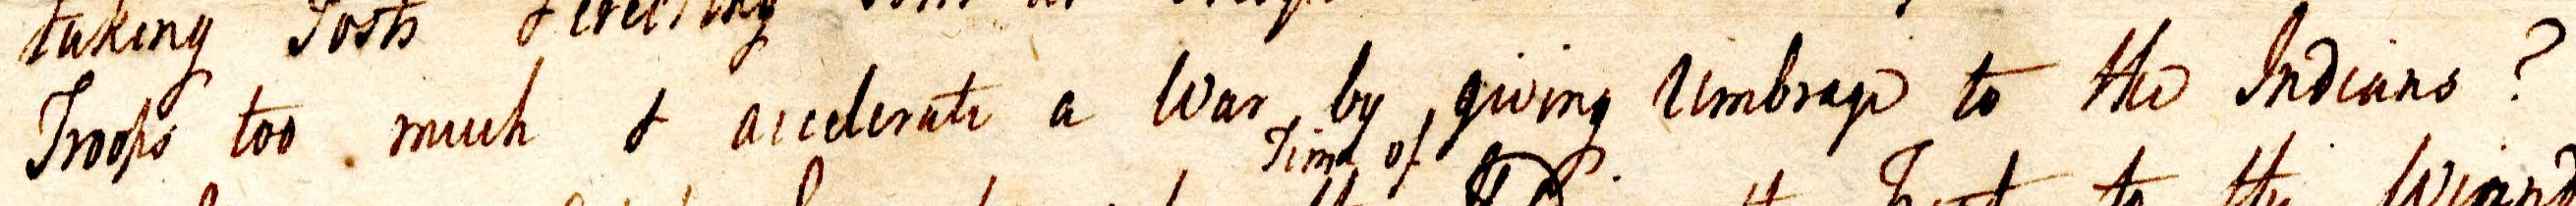Troops too much & accelerate a War by giving Umbrage to the Indians?
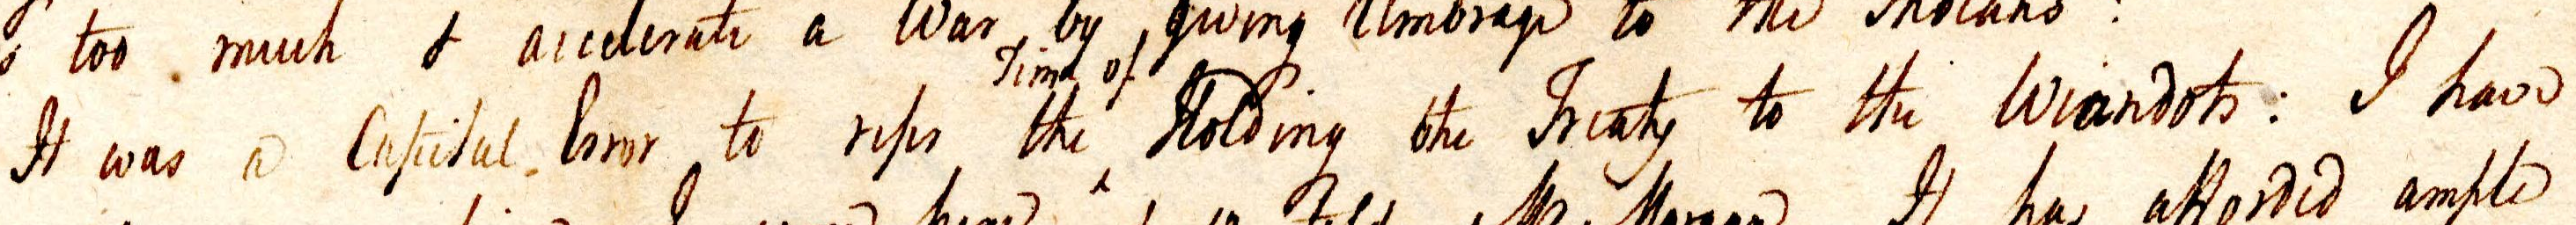It was a Capital Error to refer the ^Time of Holding the Treaty to the Wiandots: I have
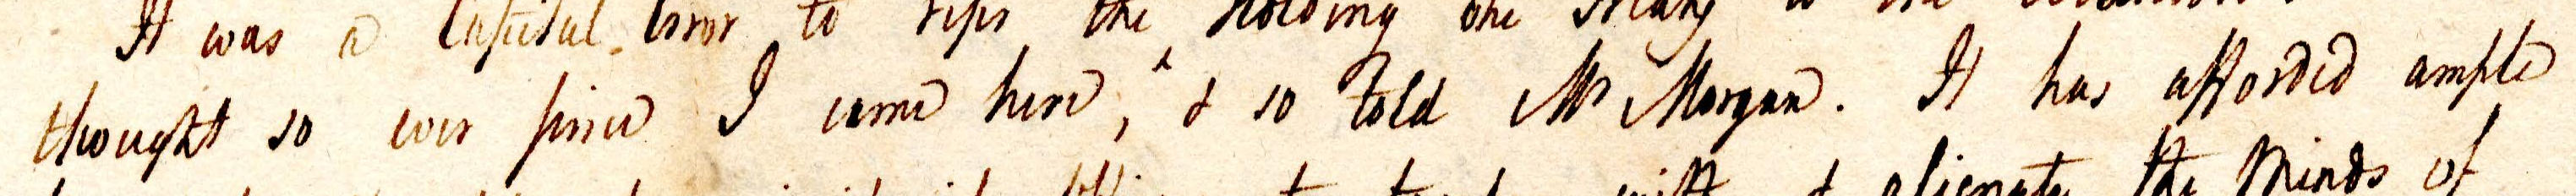thought so ever since I come here, & so told M^r Morgan. It has afforded ample
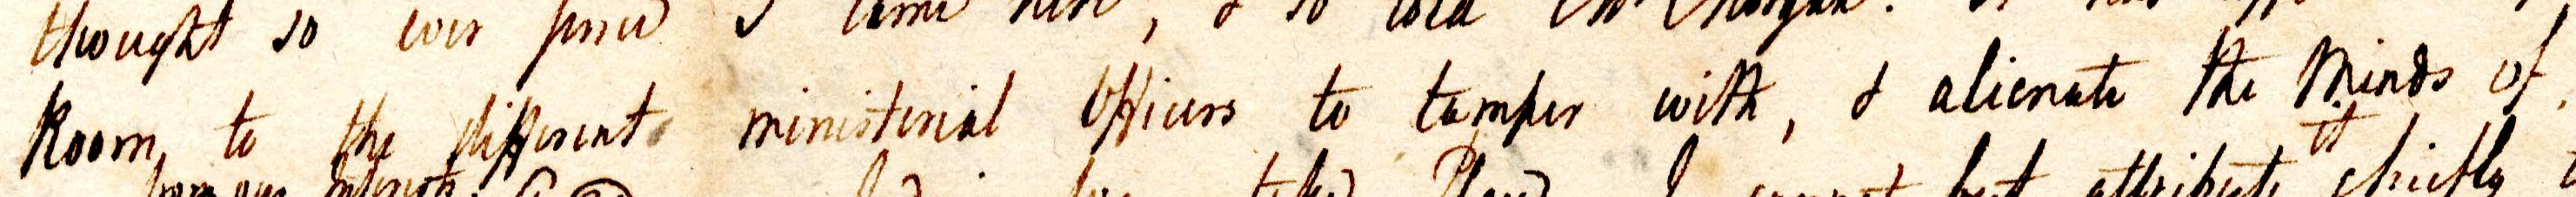Room, to the different ministerial Officers to tamper with, & alienate the Minds of
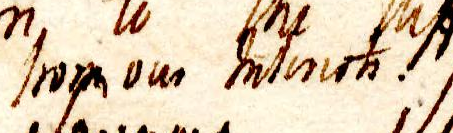from our Interests.
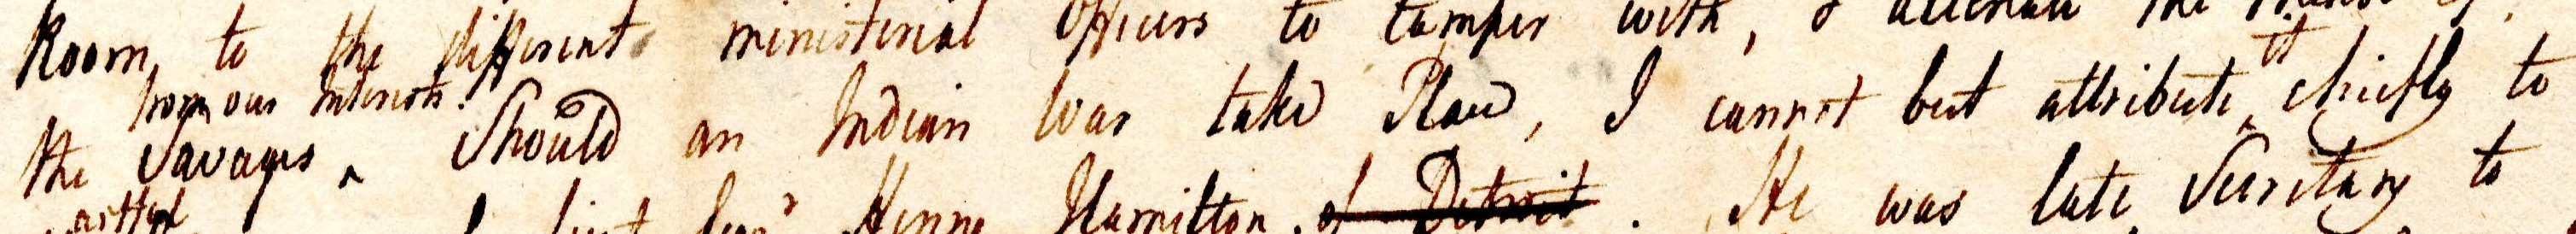the Savages ^ Should an Indian War take Place, I cannot but attribute ^it chiefly to
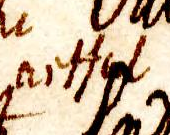artful
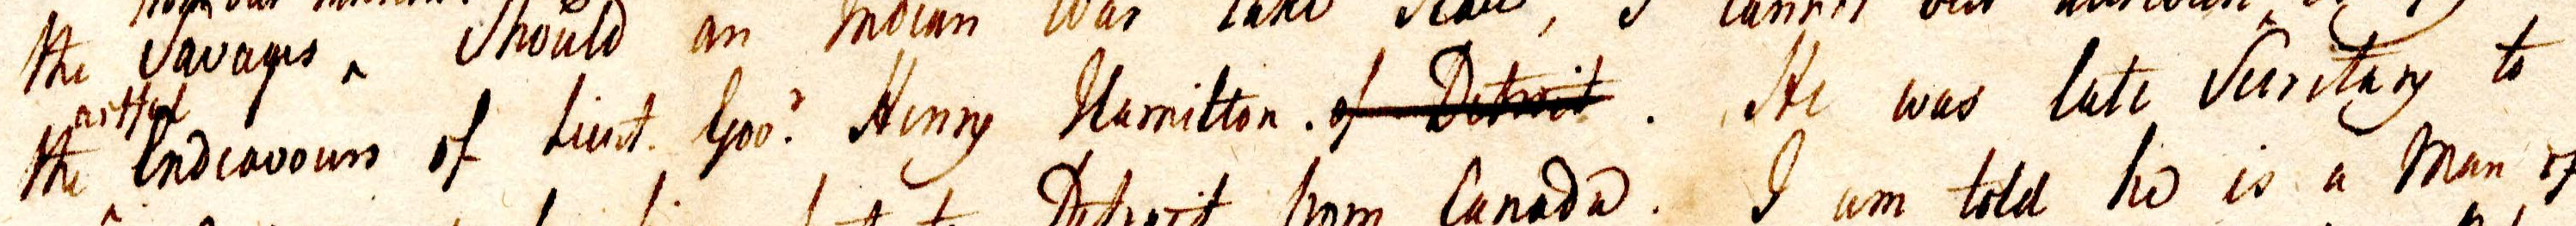the ^ Endeavours of Lieut. Gov^r. Henry Hamilton. [of Detroit]. He was late Secretary to
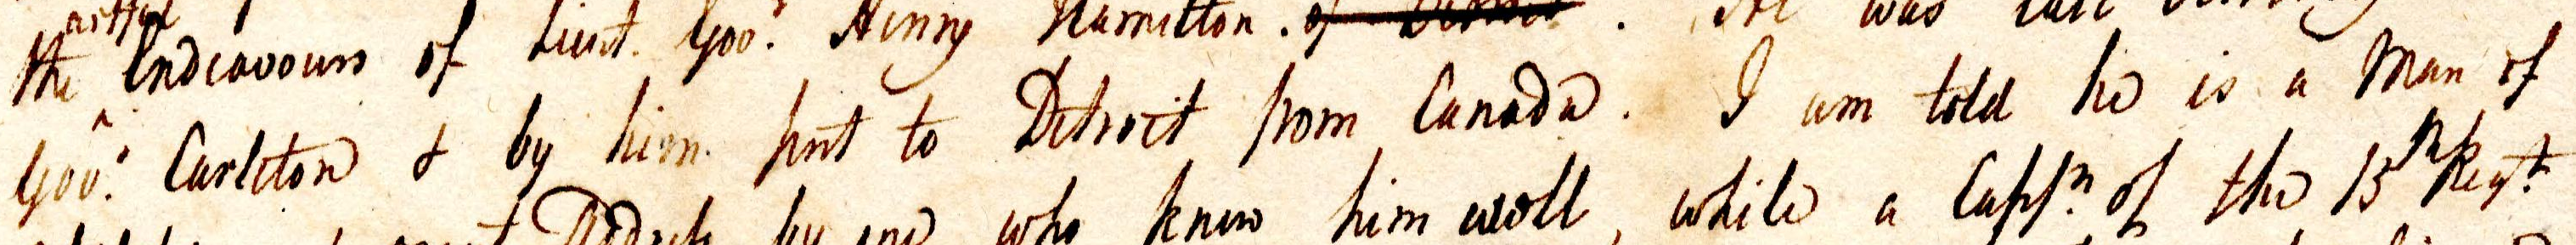Gov^r Carleton & by him sent to Detroit from Canada. I am told he is a man of
